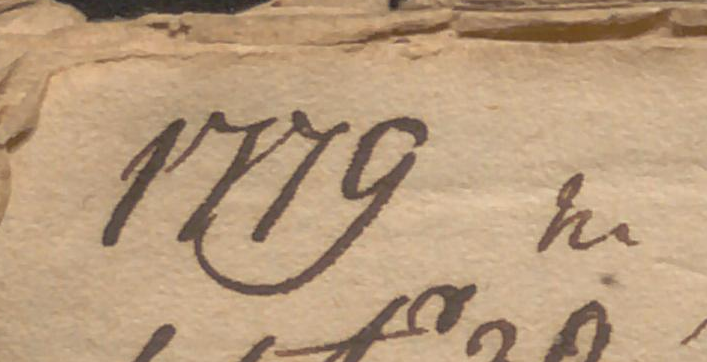1779
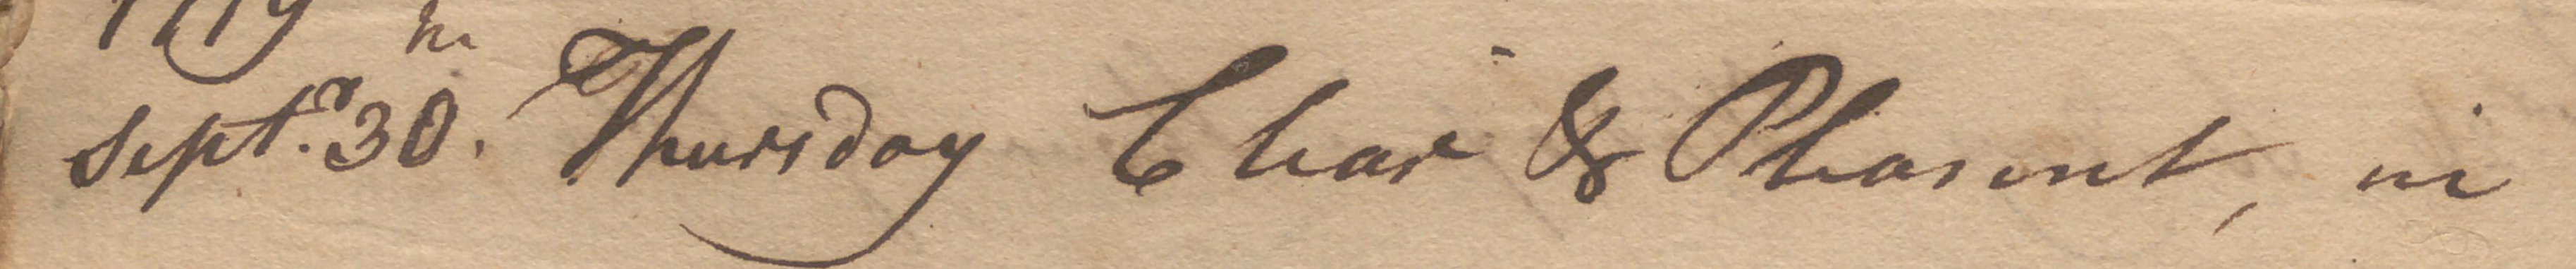Sept^r. 30^th. Thursday Clear & Pleasent, in
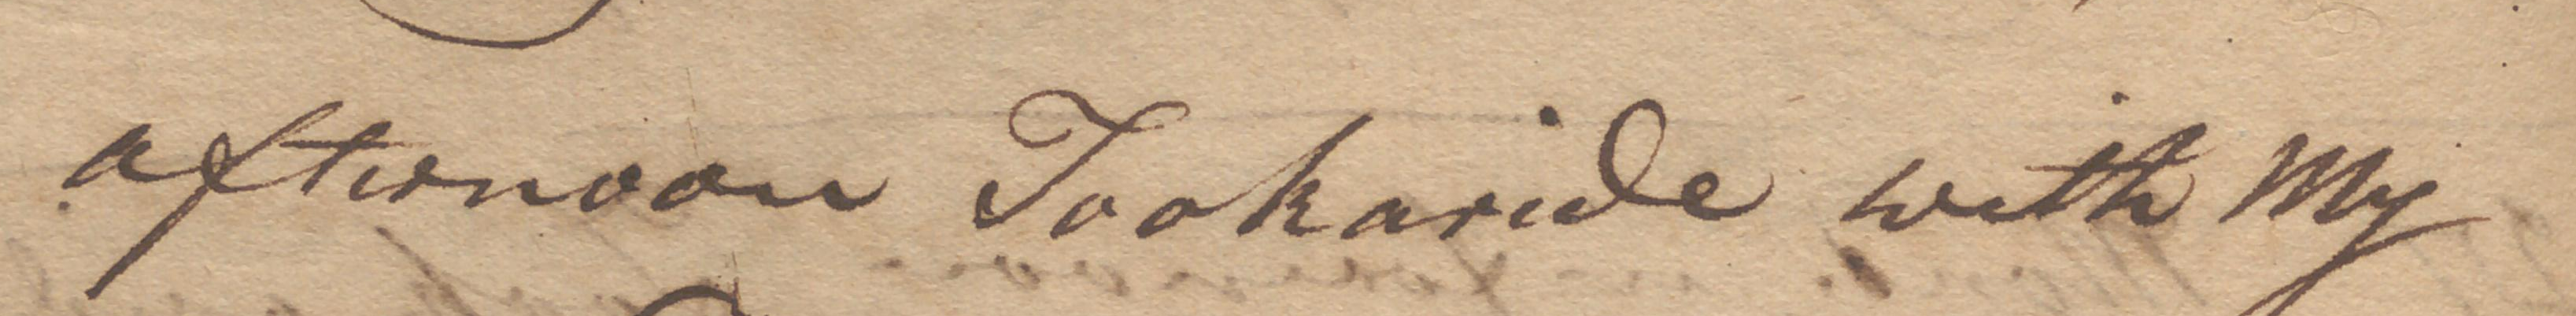afternoon Took a ride with my
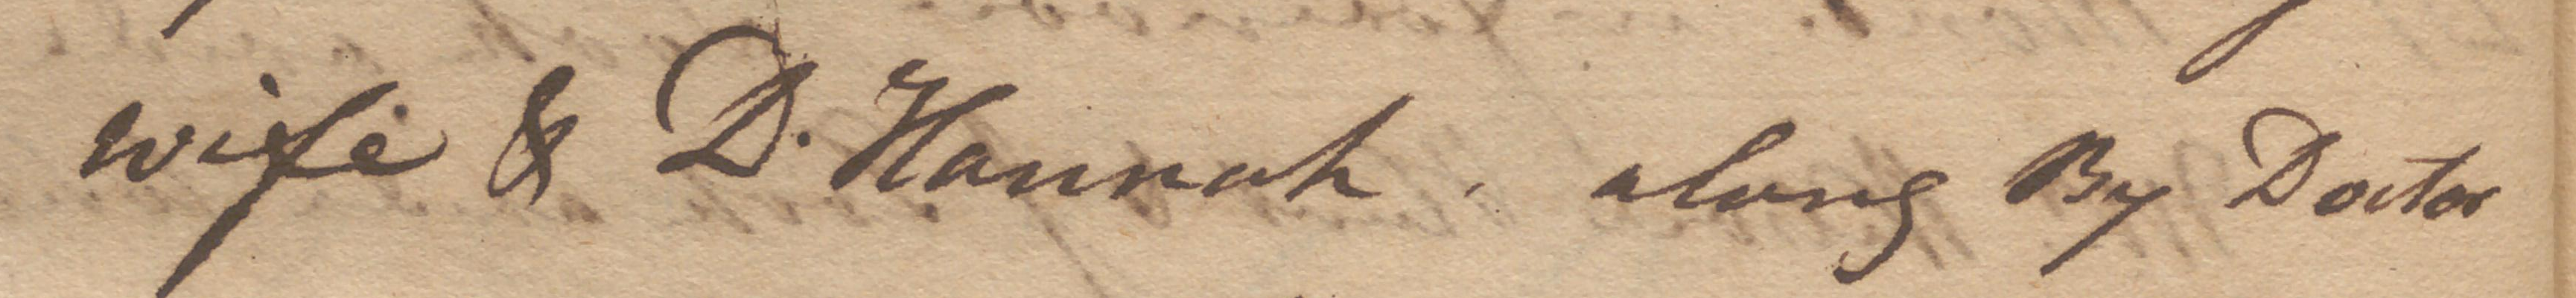wife & D^r. Hannah. along By Doctor
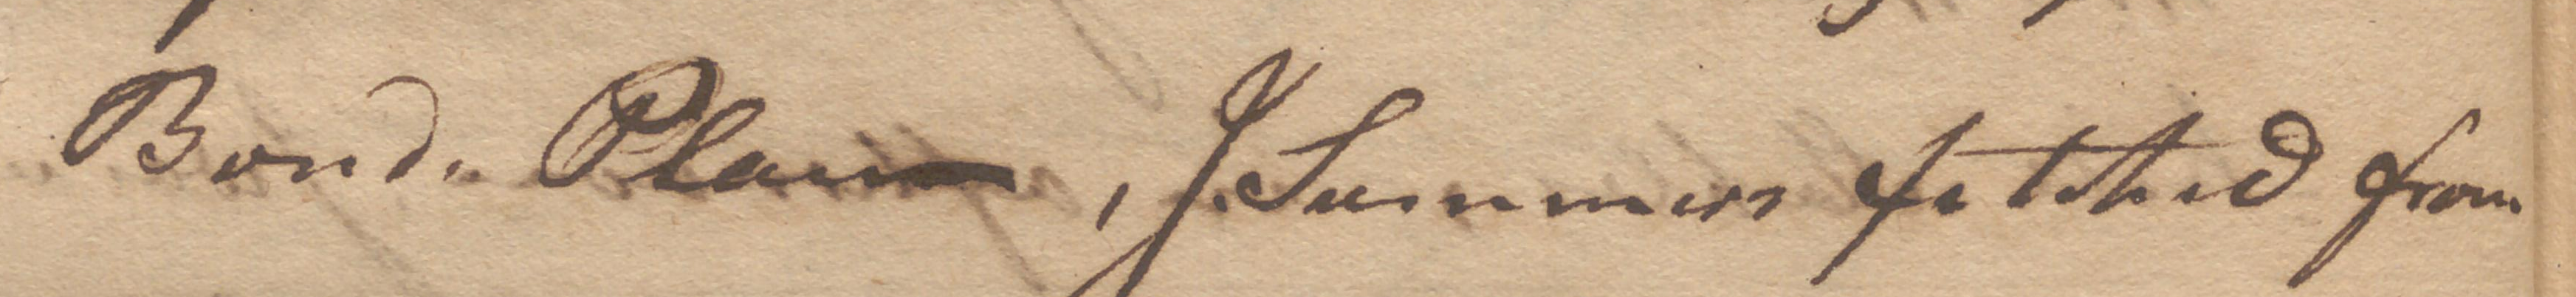Bond. Plain, J Summers fetched from
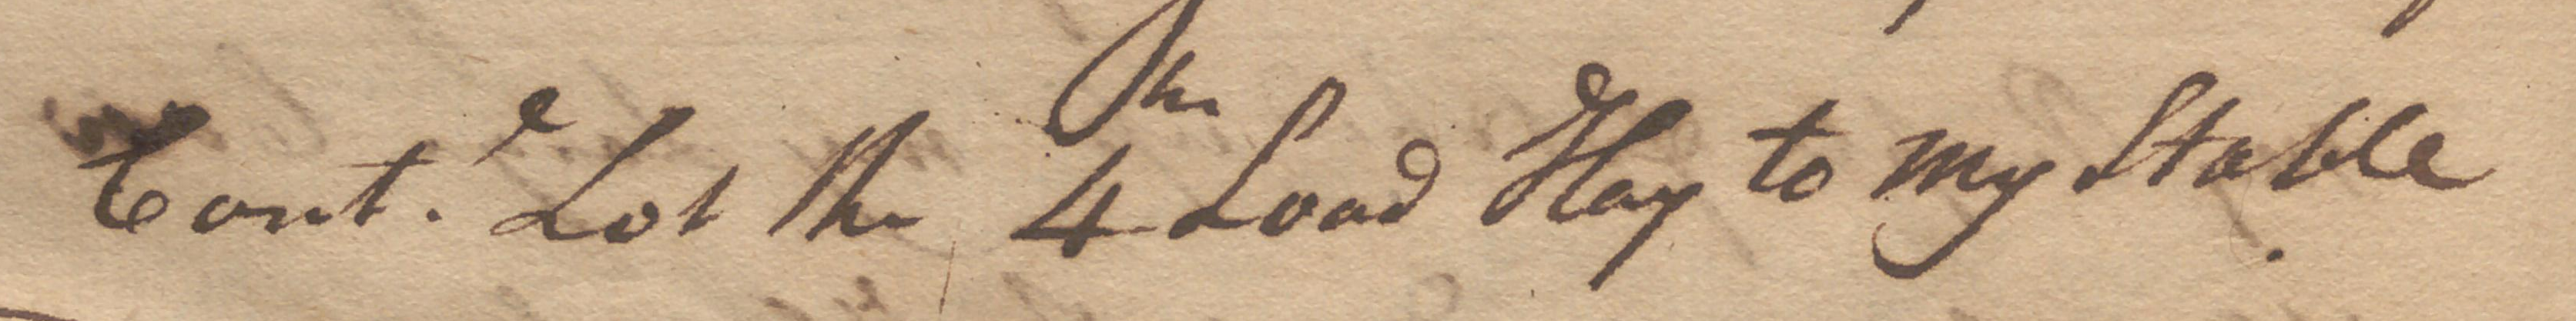Cont^l. Lot the 4^th Load Hay to my Stable
